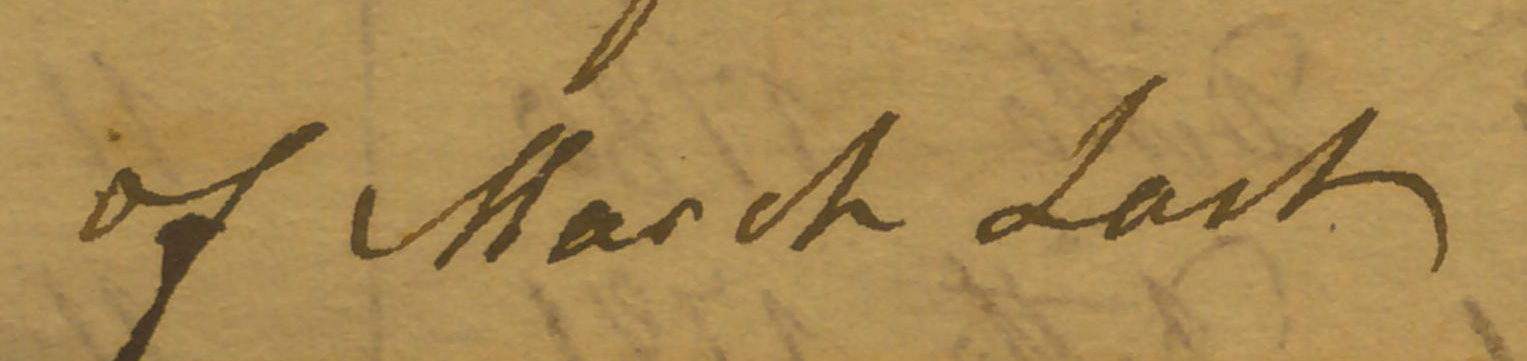of March Last
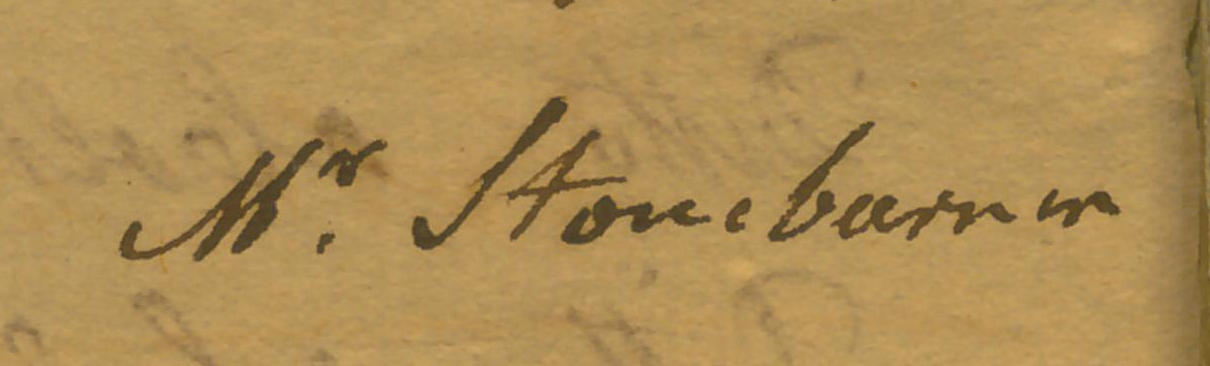M^r. Stoneburner
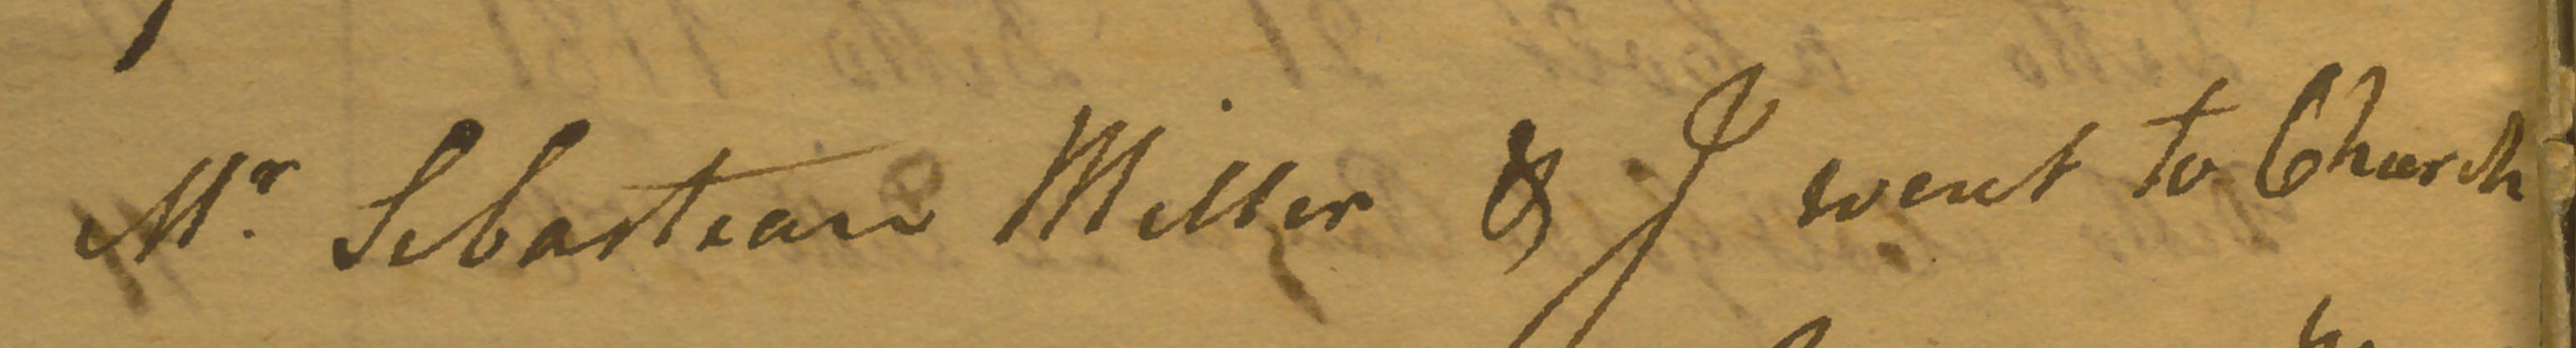M^r. Sebastian Miller & I went to Church
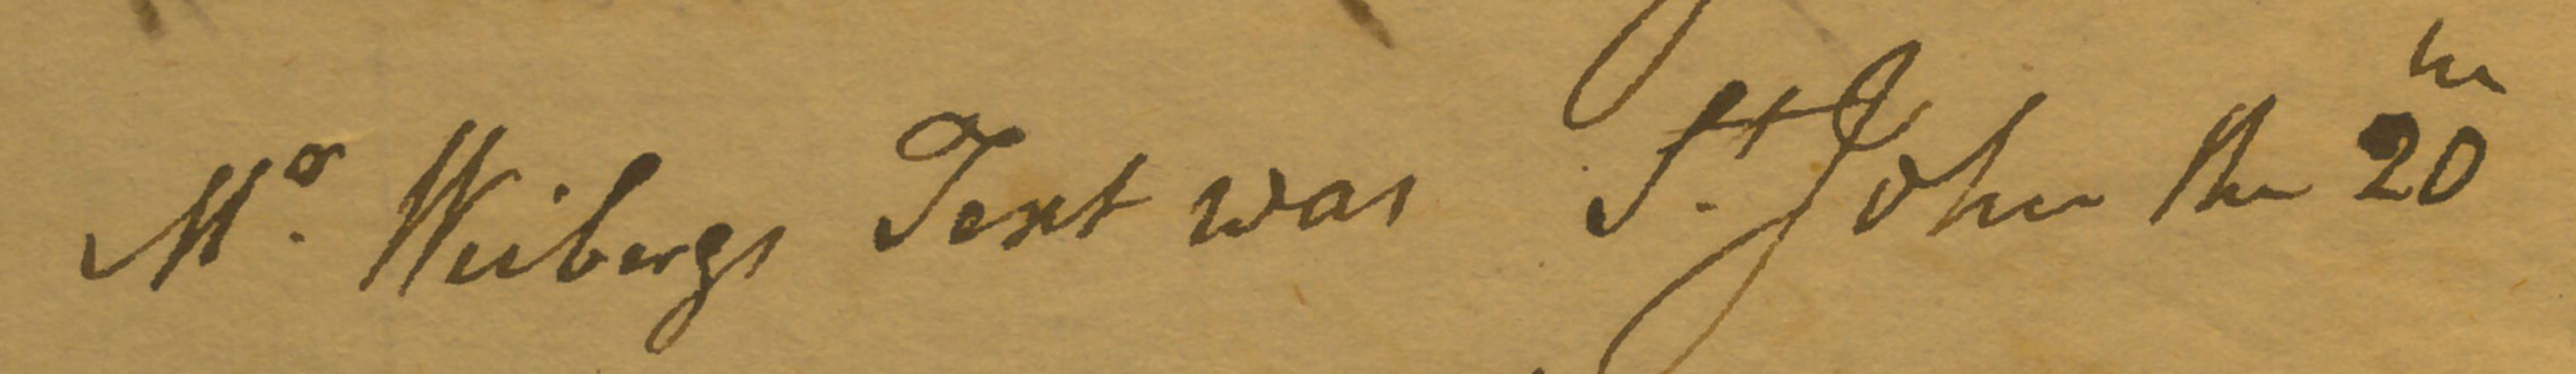M^r. Weibergs Text was S^t. John the 20th
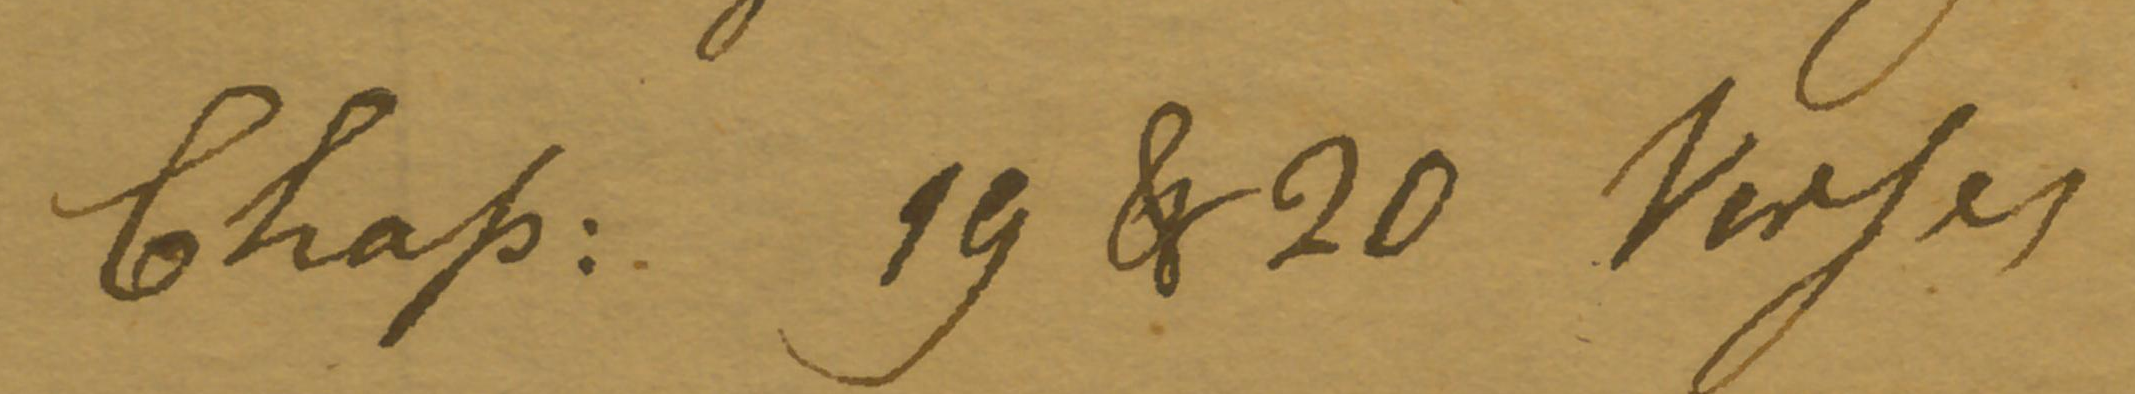Chap: 19 & 20 Verses
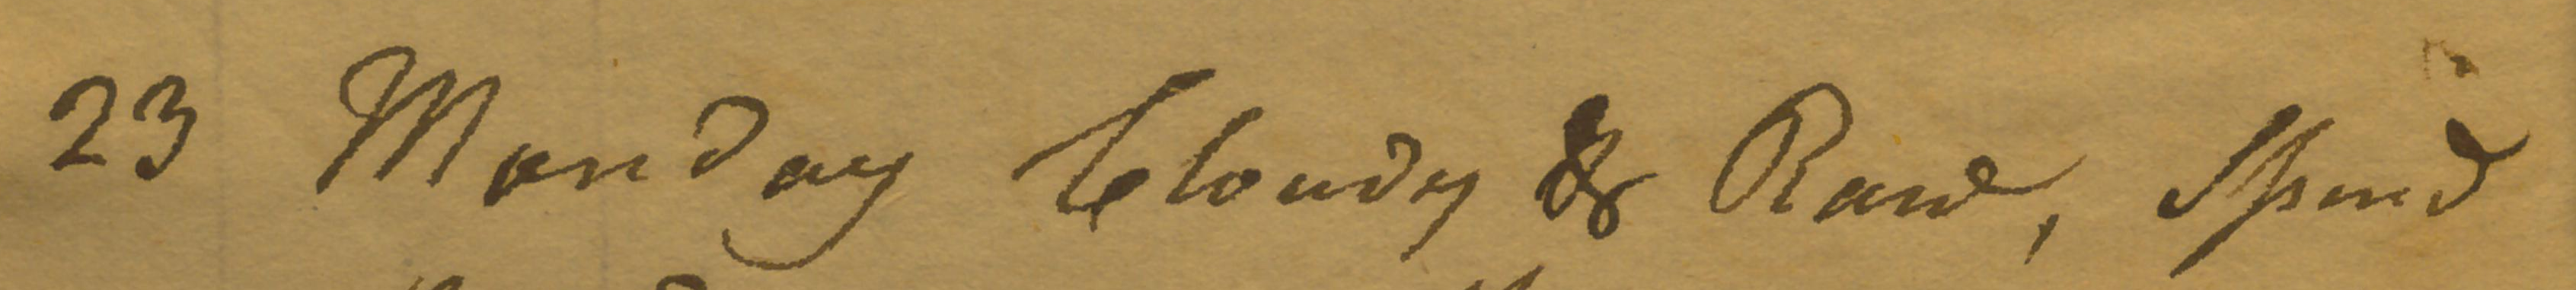23 Manday Cloudy & Raw, Spend
